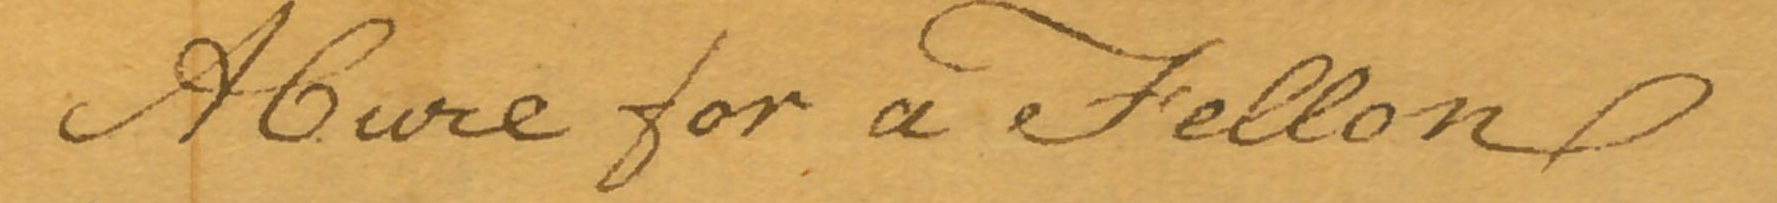A Cure for a Fellon
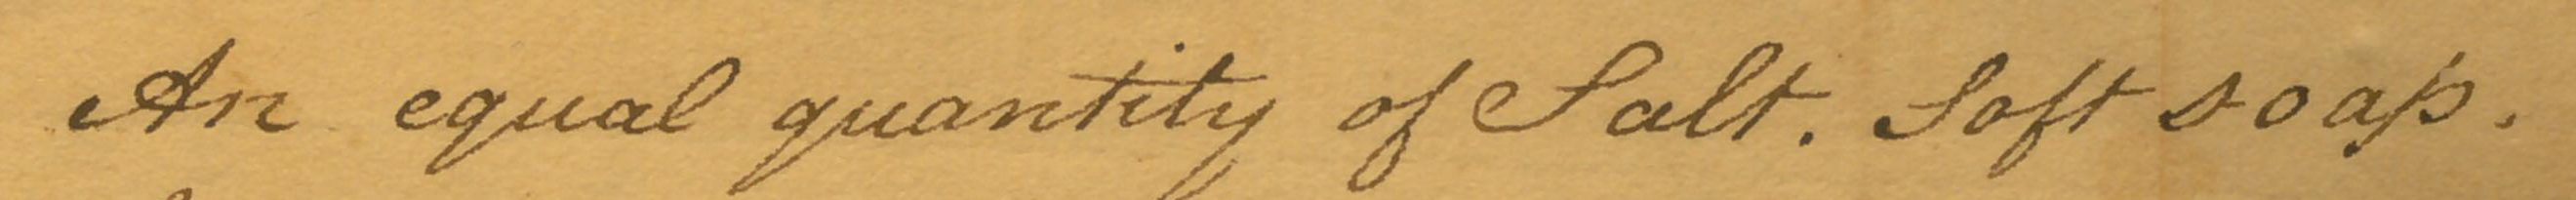An equal quantity of Salt. Soft soap.
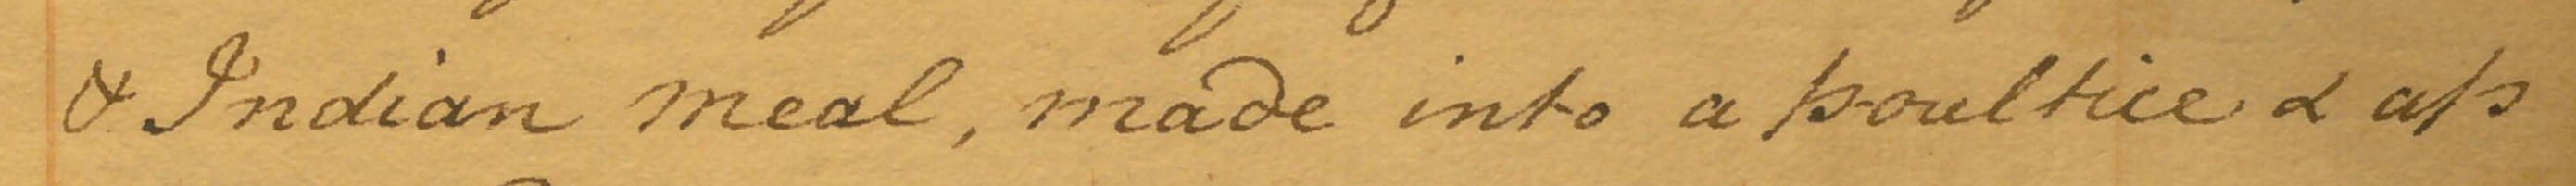& Indian meal, made into a poultice & ap
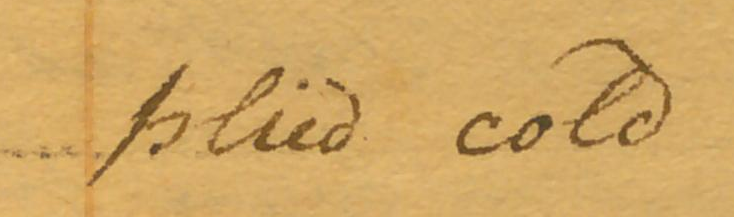plied cold
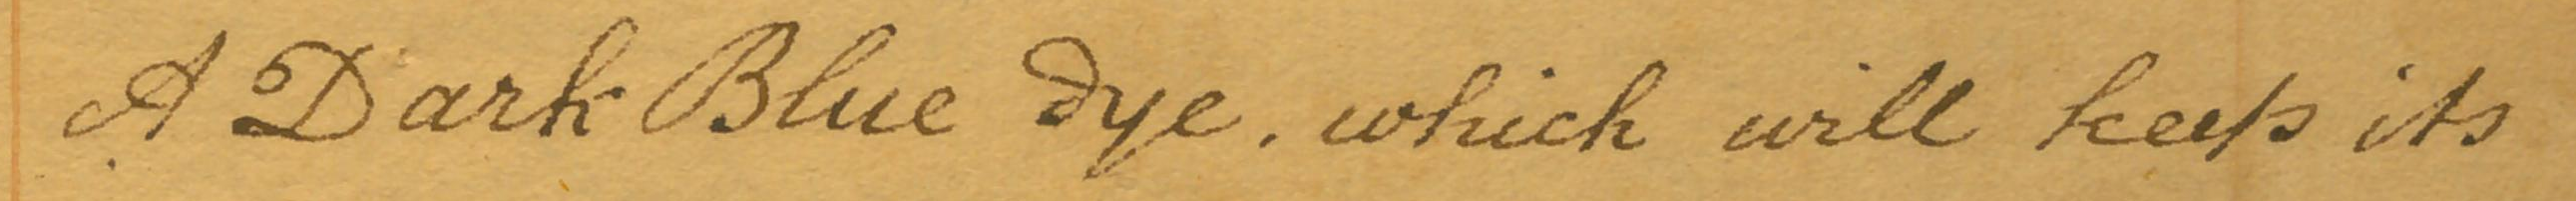A Dark Blue dye, which will keep its
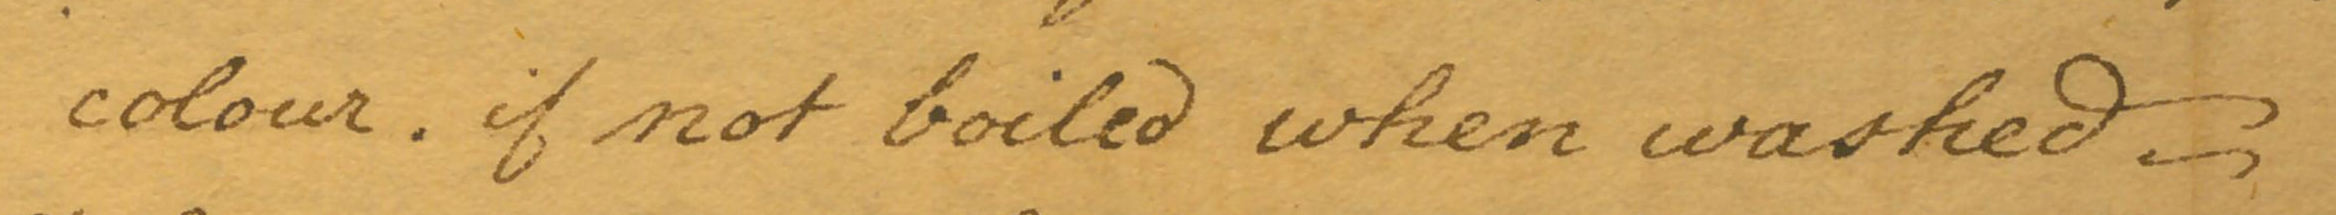colour. if not boiled when washed-
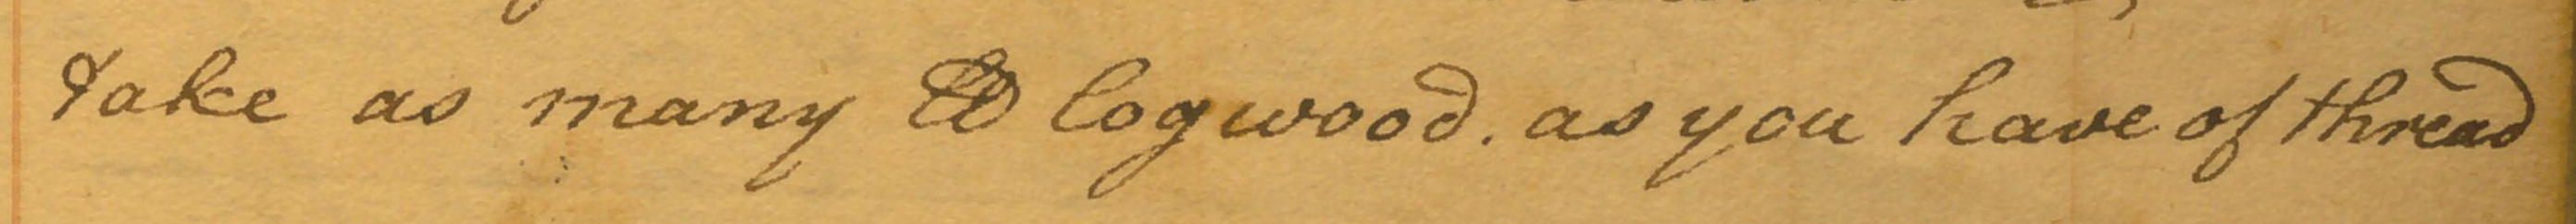take as many lb logwood as you hve of thread
